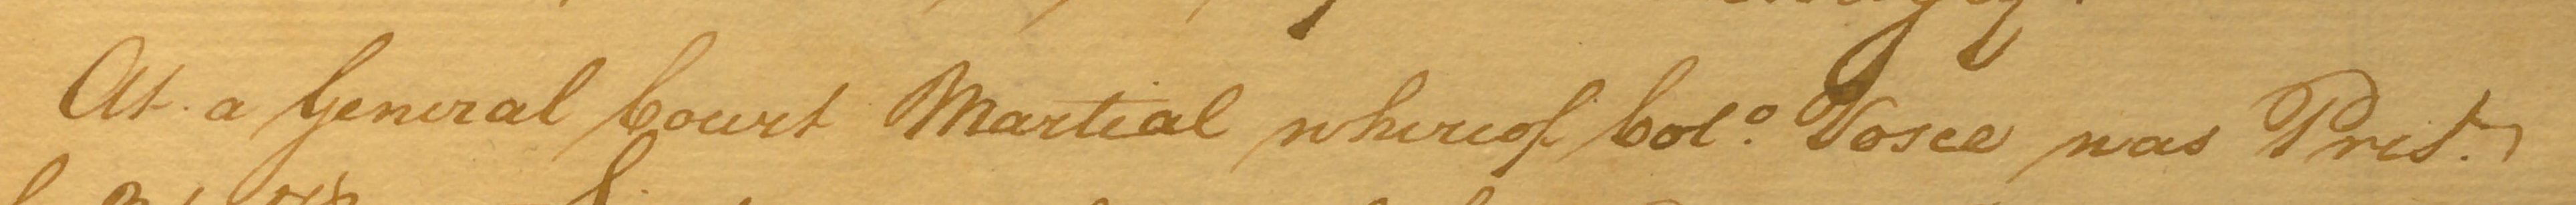At a General Court Martial whereof Col^o. Vosce was Pres^t.
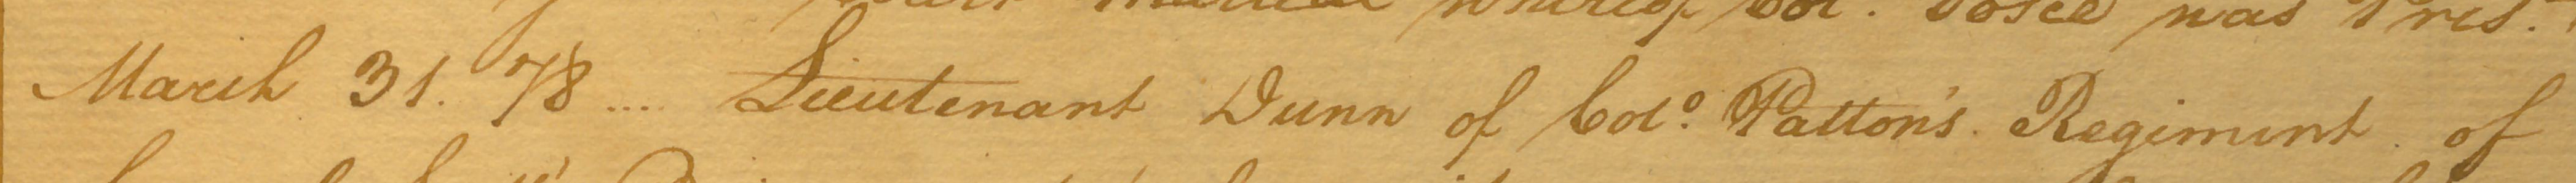March 31. 78... Lieutenant Dunn of Col^o. Patton's Regiment of
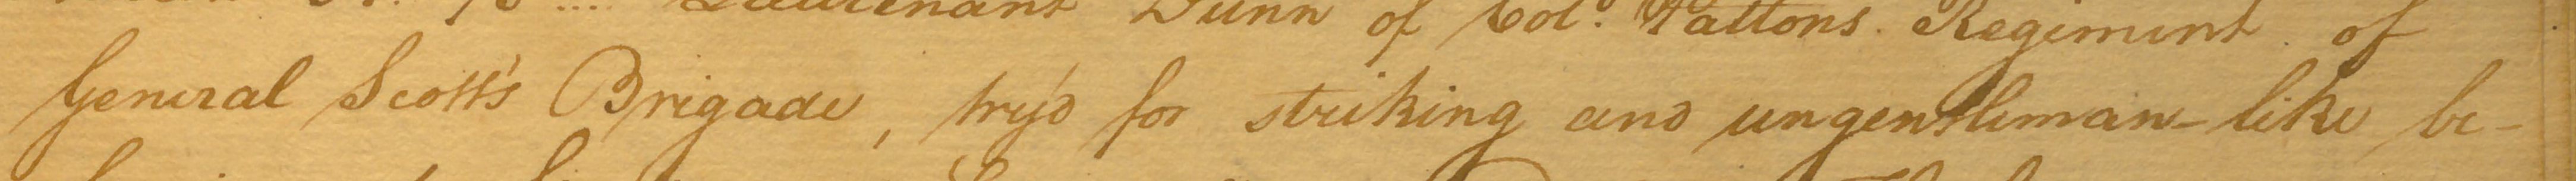General Scott's Brigade, try'd for striking and ungentleman-like be-
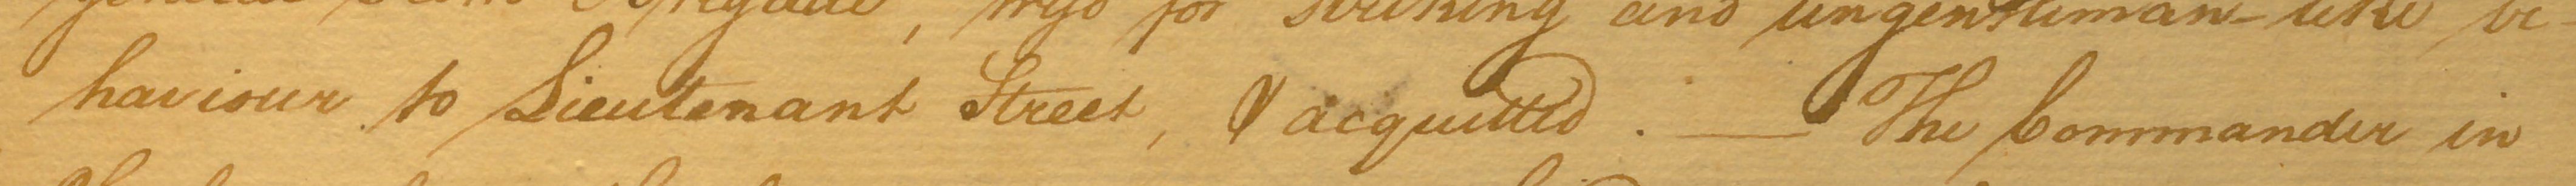haviour to Lieutenant Street, & acquitted.- The Commander in
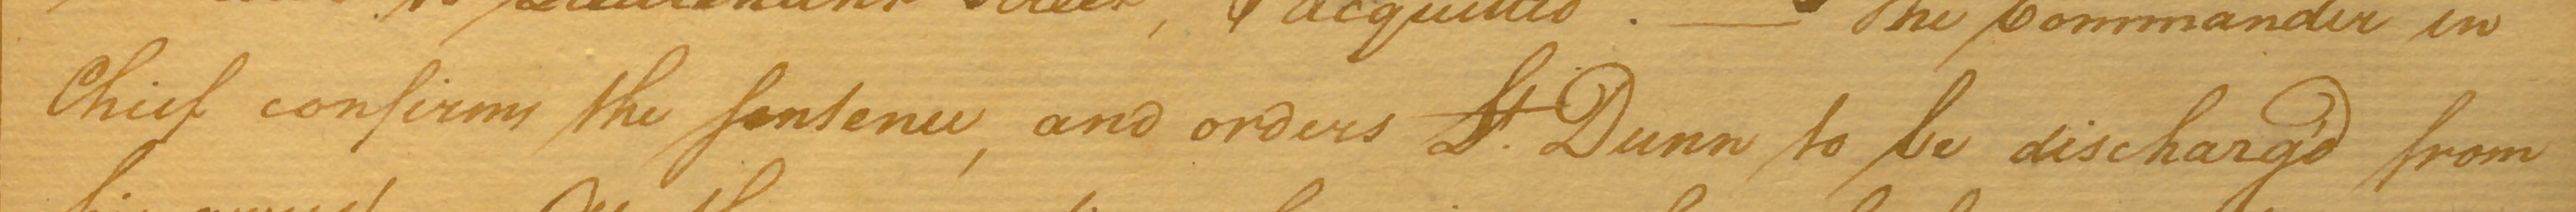Chief confirms the sentence, and orders L^t. Dunn to be discharg'd from
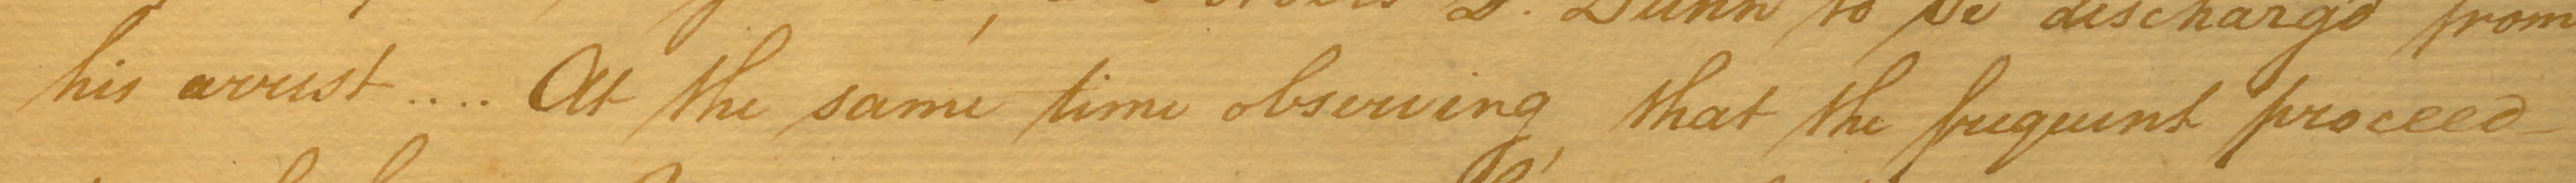his arrest.... At the same time observing, that the frequent proceed
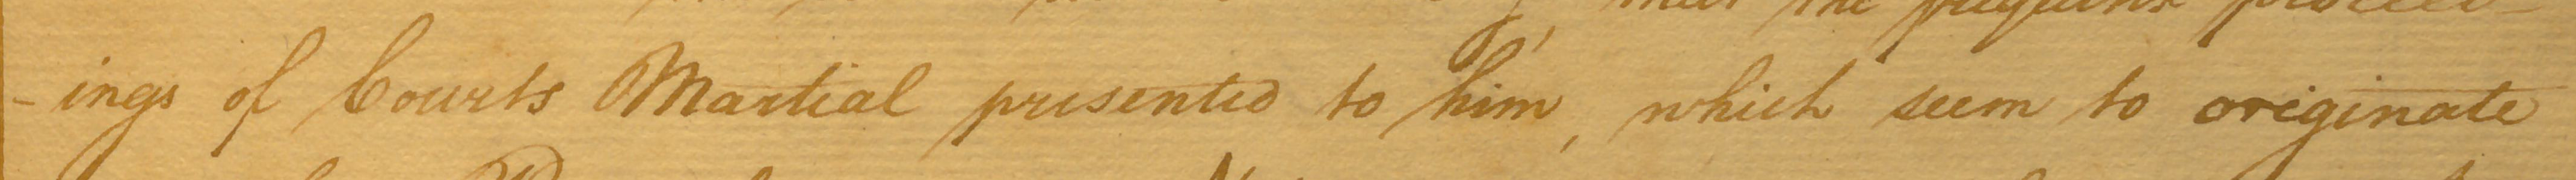-ings of Courts Martials presented to him, which seem to originate
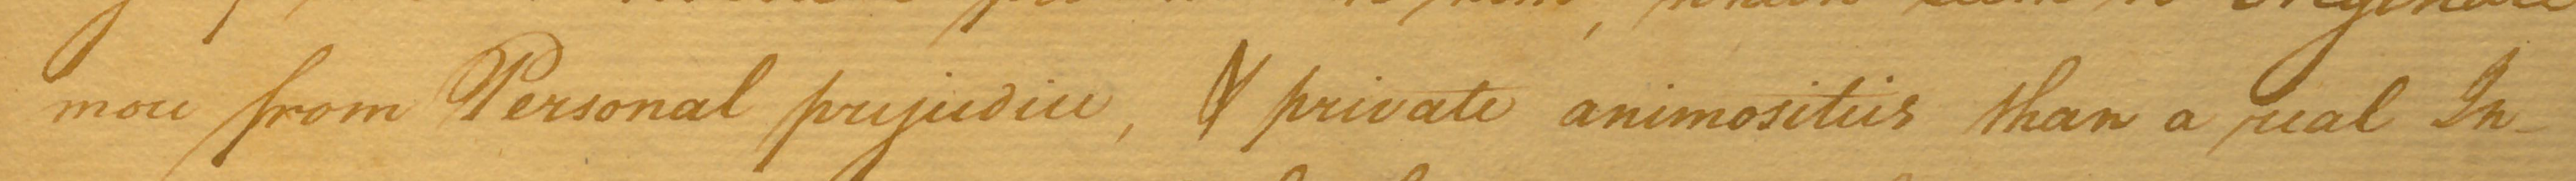more from Personal prejudice, & private animosities than a real In-
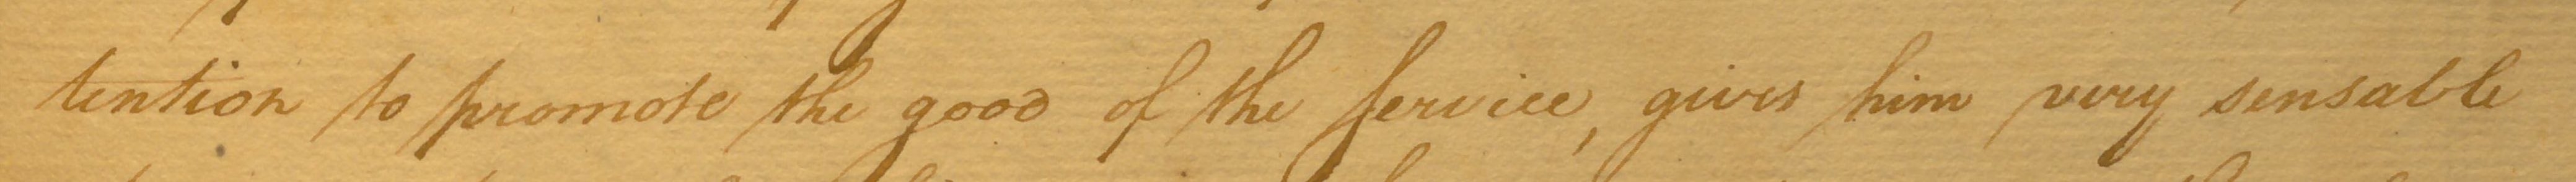tention to promote the good of the service, gives him very sensable
